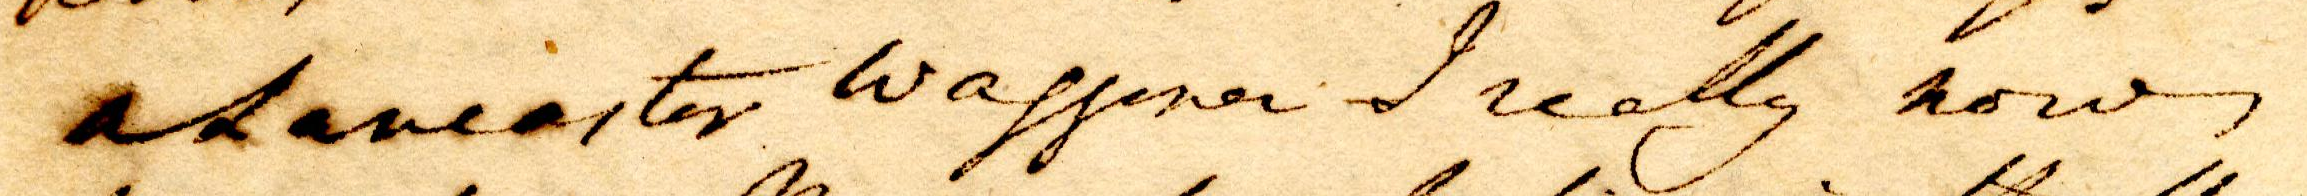a Lancaster waggoner I really now
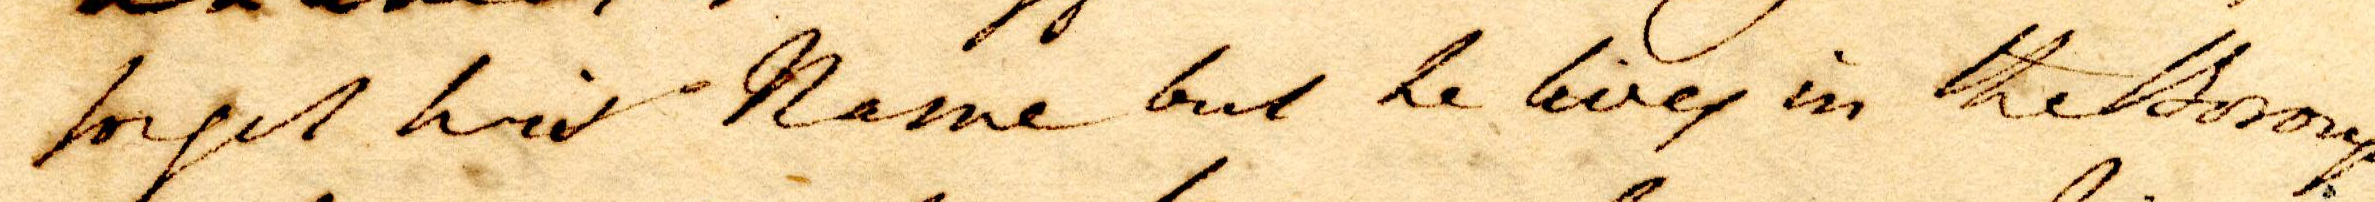forget his Name but he leves in the Borough
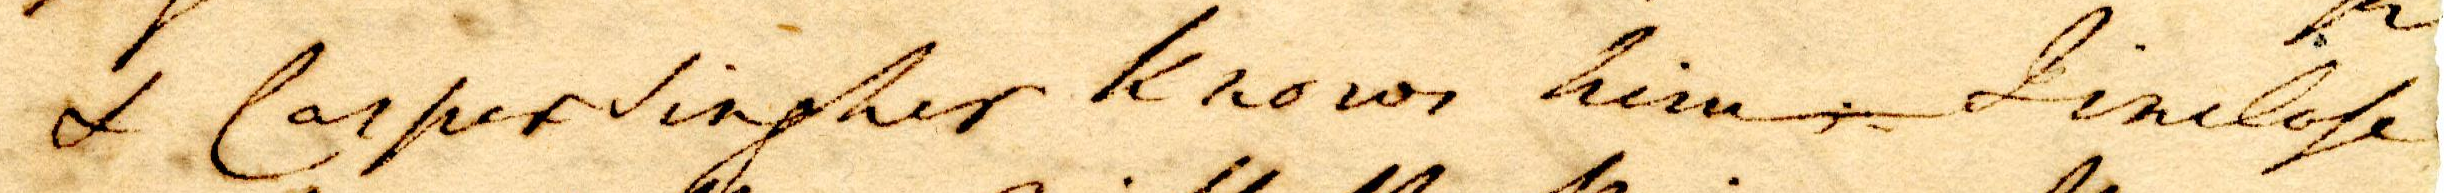& Casper Singher knows him. Inclose
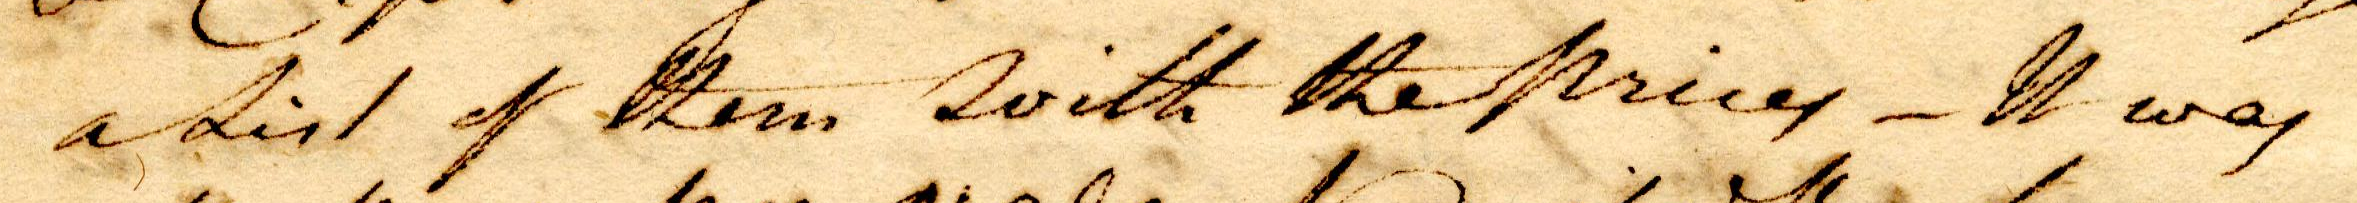a List of them with the prices. It was
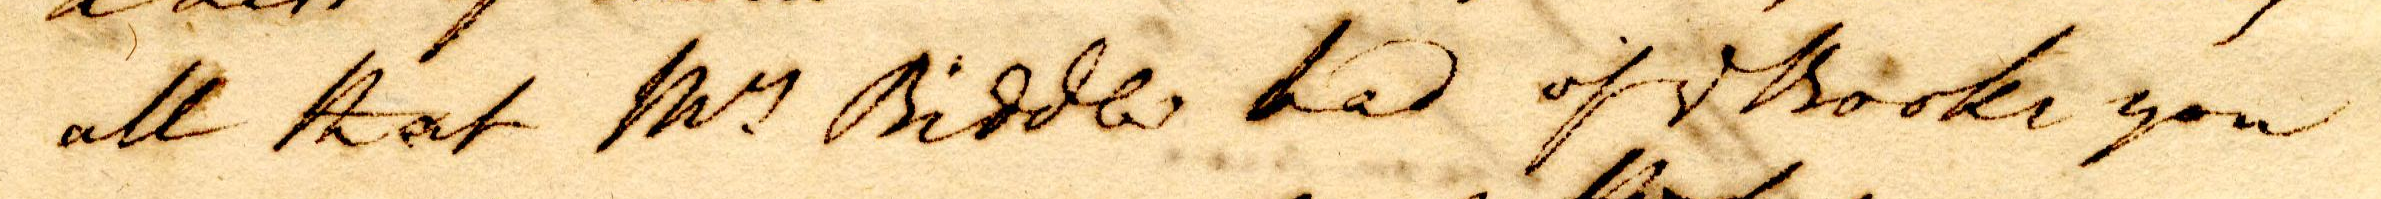all that M^rs. Biddle had of y^e Books you
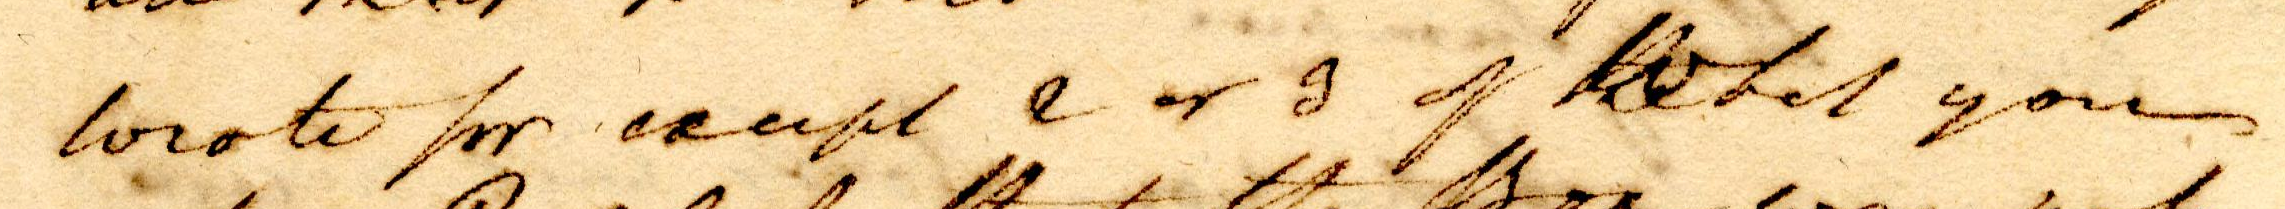wrote for except 2 or 3 of what you
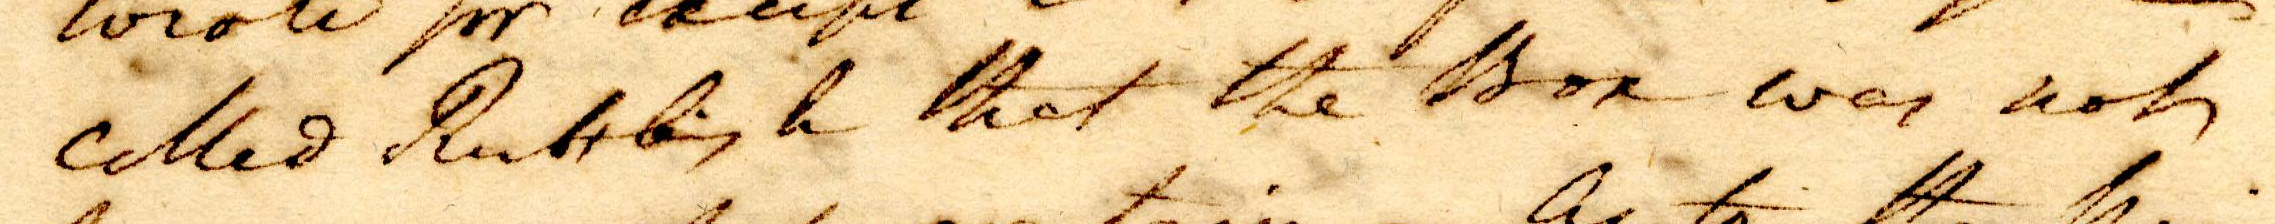called Rubbish that the Box was not
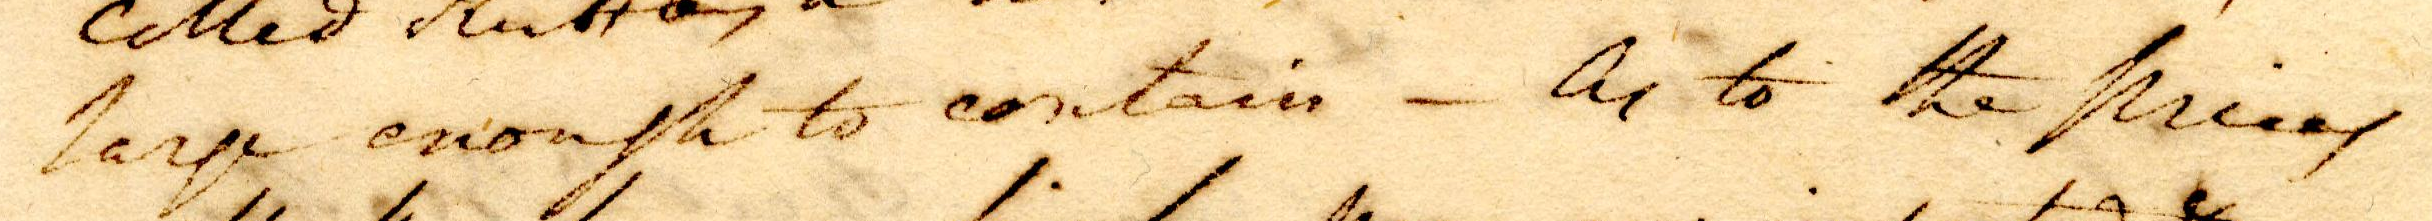large enoush to contain. As to the prices
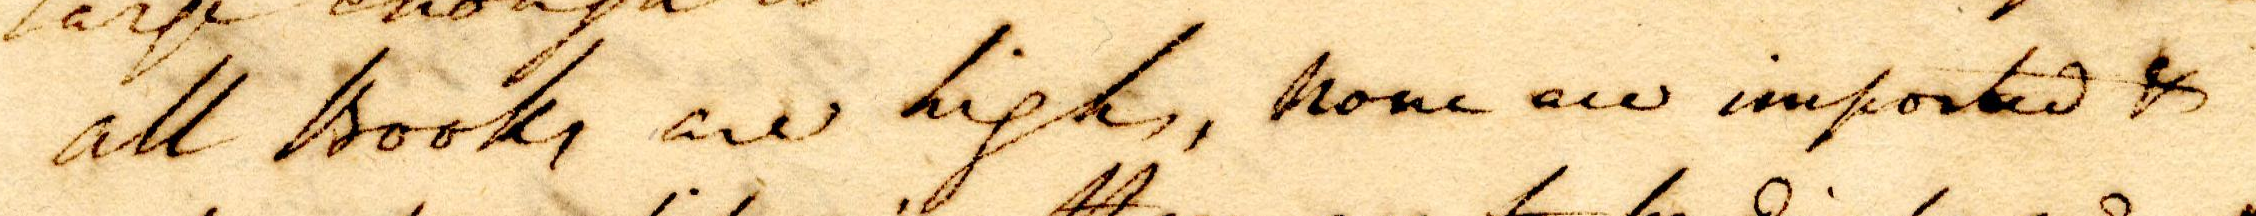all Books are highs, none are imported &
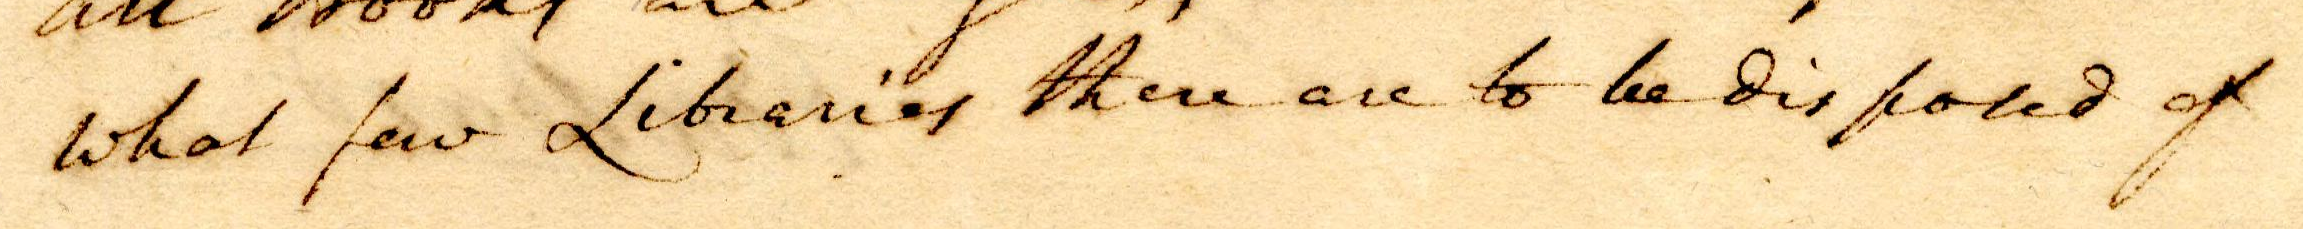what few Libraries there are to be disposed of
